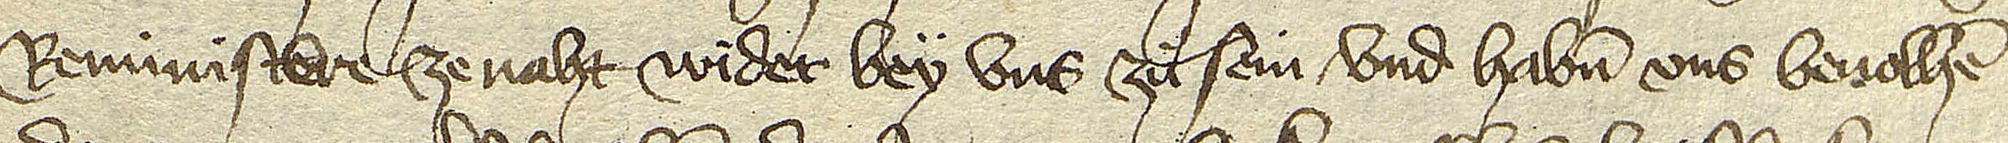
Reminiſcere cʒe naht wider bey vns cʒu ſein / vnd habn* vns beuolhe*
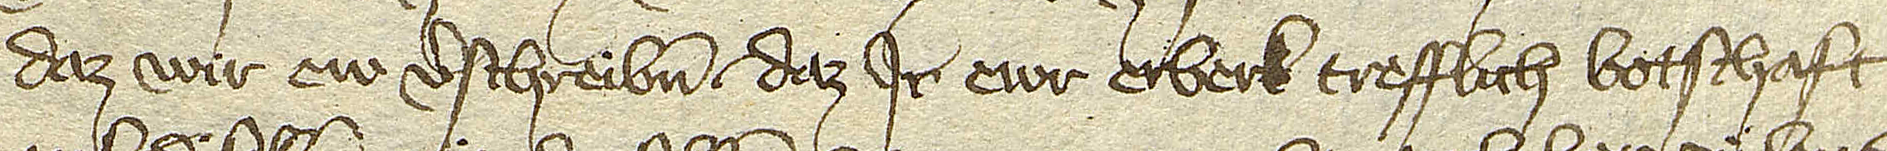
daʒ wir ew v*ſchreibn* / daʒ Ir ewr erberk* trefflich botſchaft
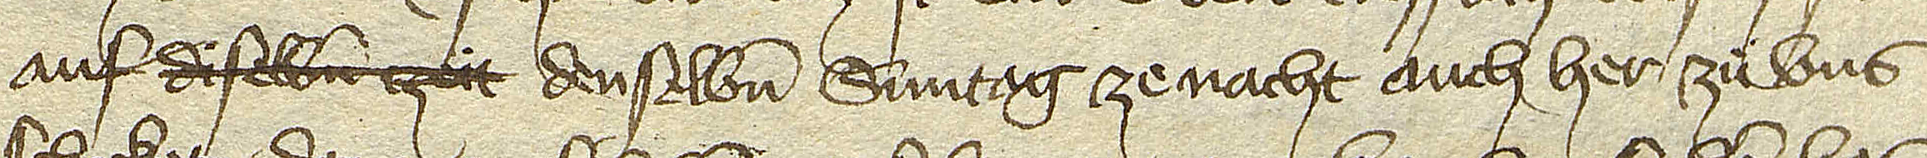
auf diſelbn* cʒeit denſelbn* Suntag cʒenacht auch her cʒü vns
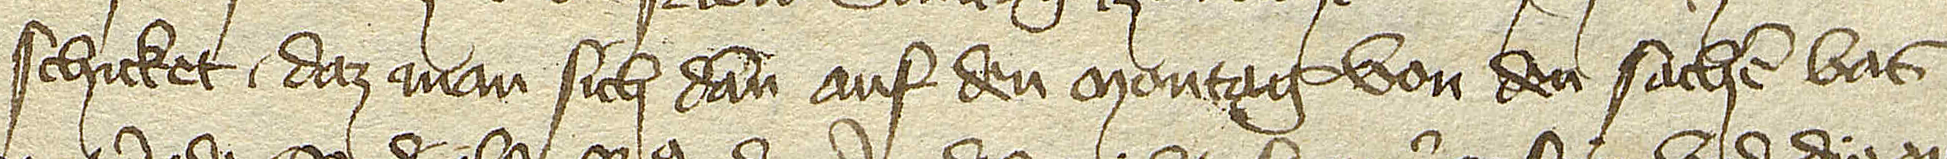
ſchicket / daʒ man ſich dan* auf den Montag von den ſache* bas
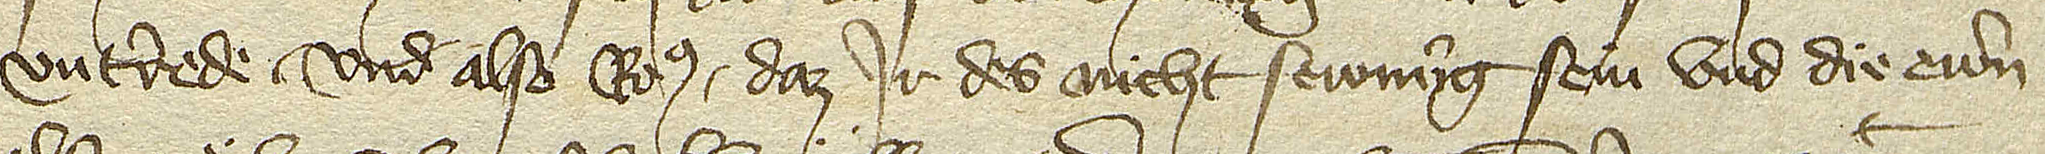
vnt*rede / vnd alſo Ro* / daʒ Ir des nicht ſewmig ſein vnd die ew*n
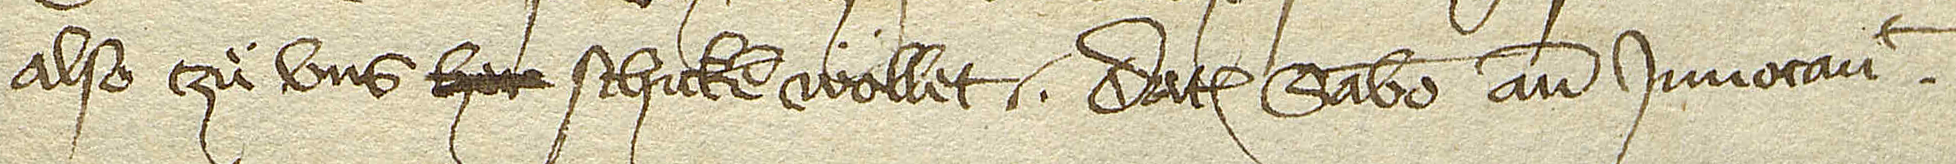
alſo cʒü vns her ſchicke* wöllet / . Dat* Sabo* an* Inuocau* .
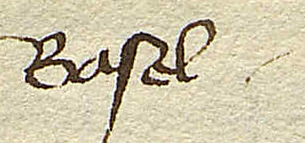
Baſel /
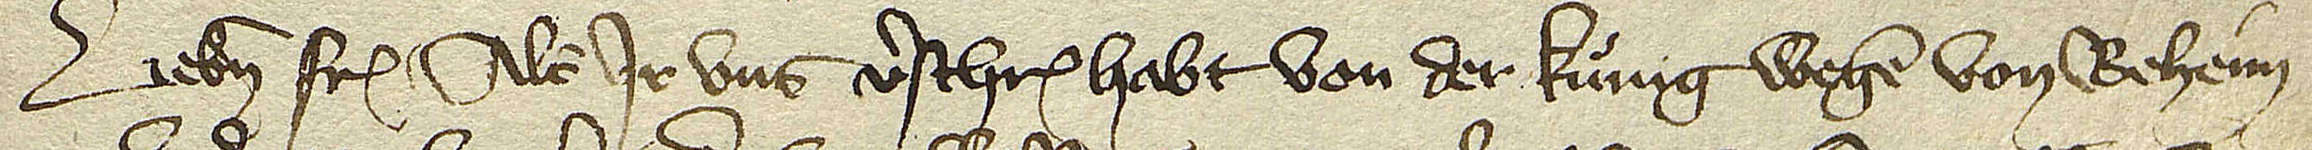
Liebn* fr* / Als Ir vns vſchr* habt von der künig wege* von Beheim
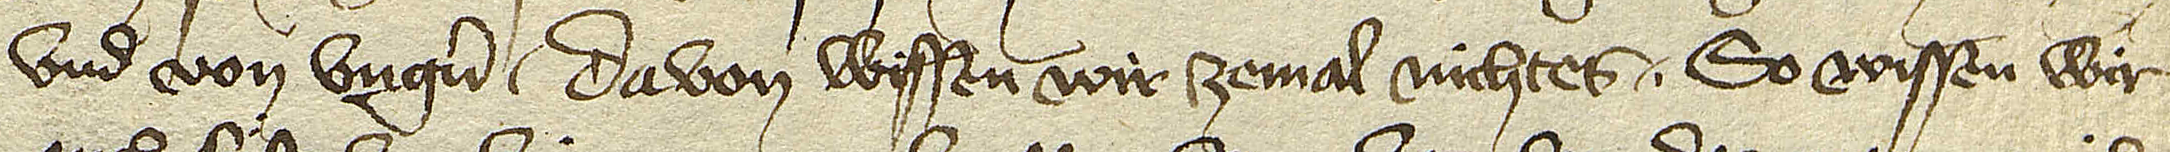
vnd von vngn* / Davon wiſſen wir cʒemal nichtes / . So wiſſen wir
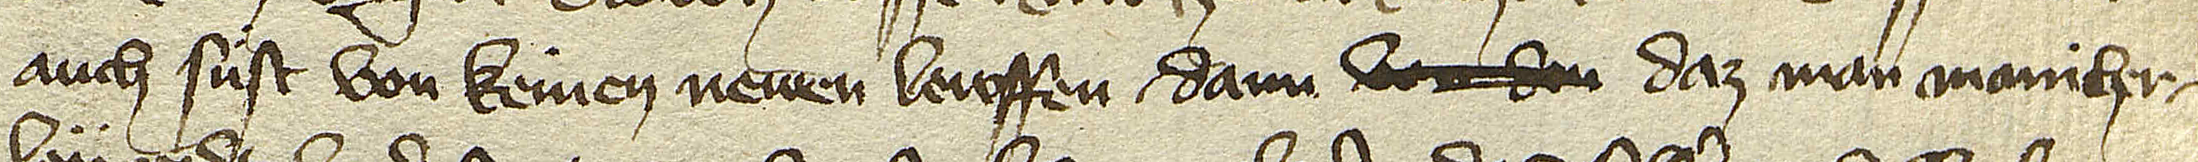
auch ſüſt von keinen newen lewffen / dann von den daʒ man manicher /
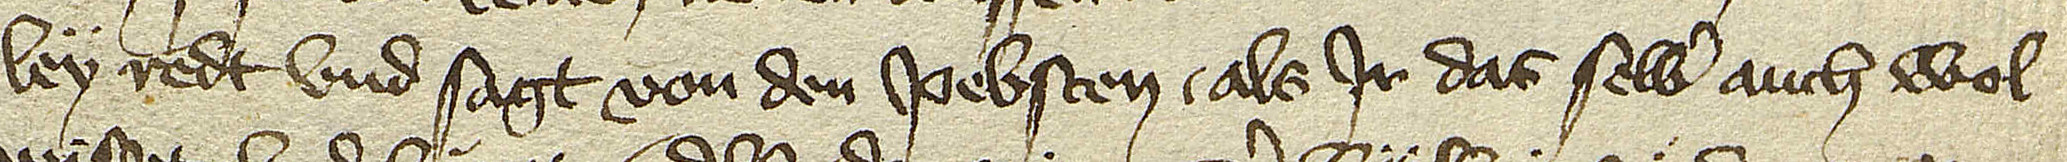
ley redt vnd ſagt von den Pebſten / als Ir das ſelb* auch wol
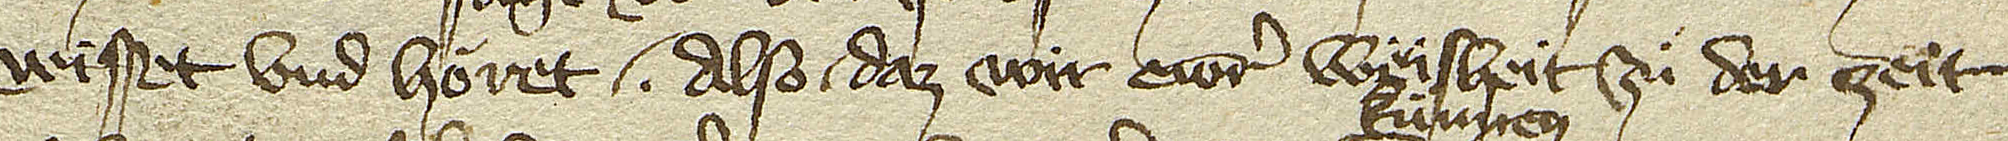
wiſſet vnd höret / . Alſo / daʒ wir ewr* weiſheit cʒü der cʒeit
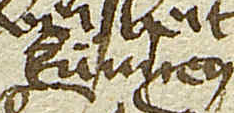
künnen
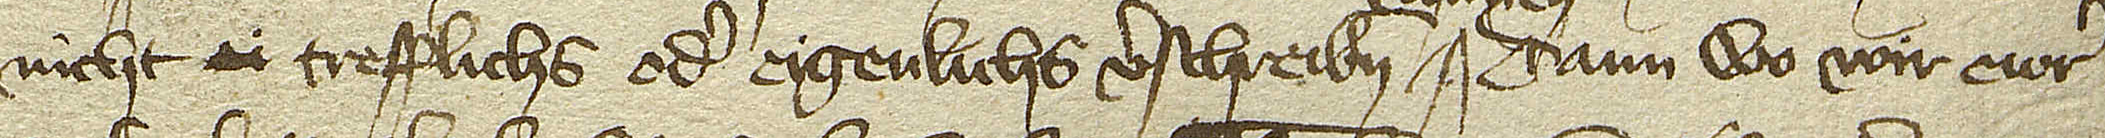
nicht ei trefflichs od* eigenlichs v*ſchreibn* / Dann wo wir ewr*
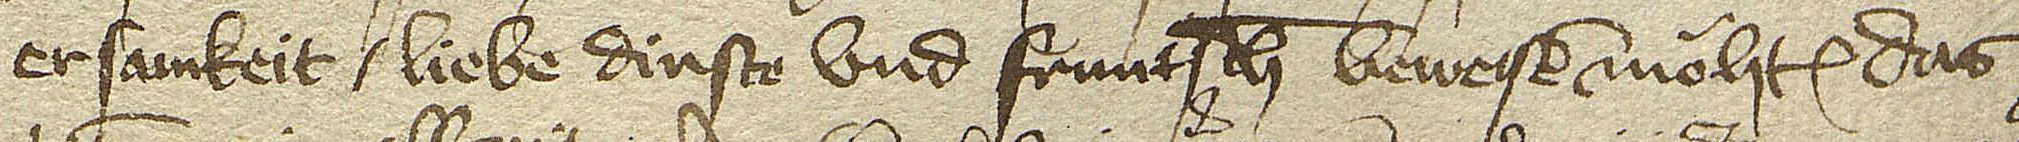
erſamkeit / liebe dinſte vnd fruntſch* beweiſe* möht* das
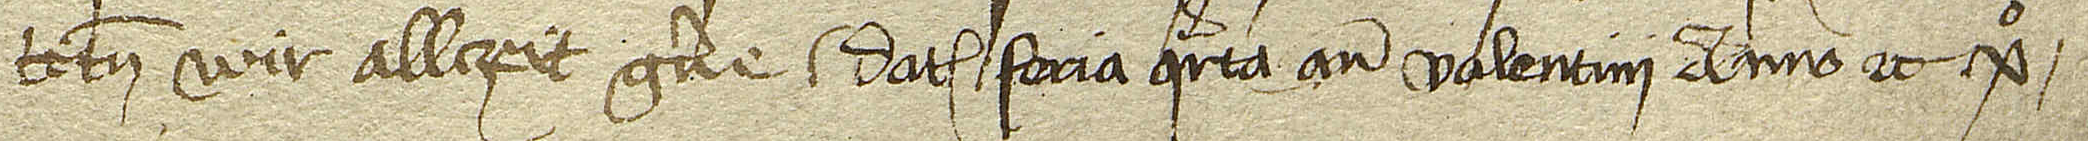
tetn* wir allcʒeit g*ne / dat* / feria q*rta an* valentini Anno ec* x*/
